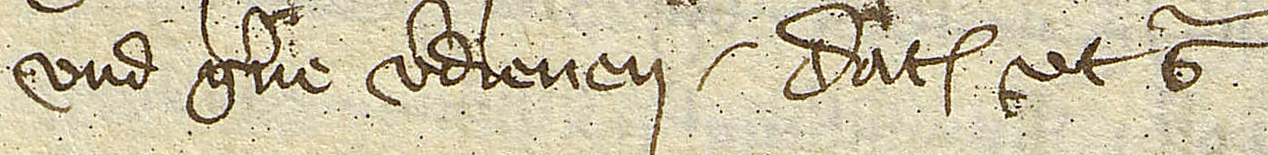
vnd g*ne v*dienen / Dat* vt s*
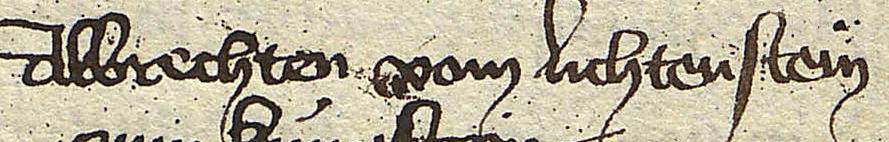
Albrechten vom lichtenſtein
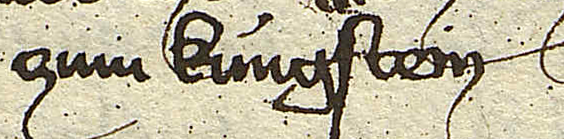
cʒum künigſtein
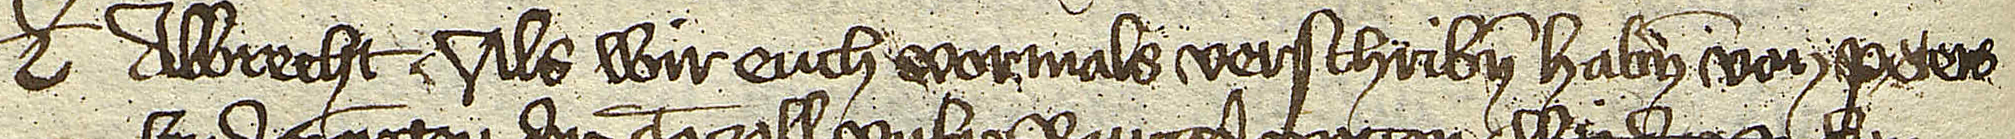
L* Albrecht / Als wir euch vormals verſchribn* habn* von Peters
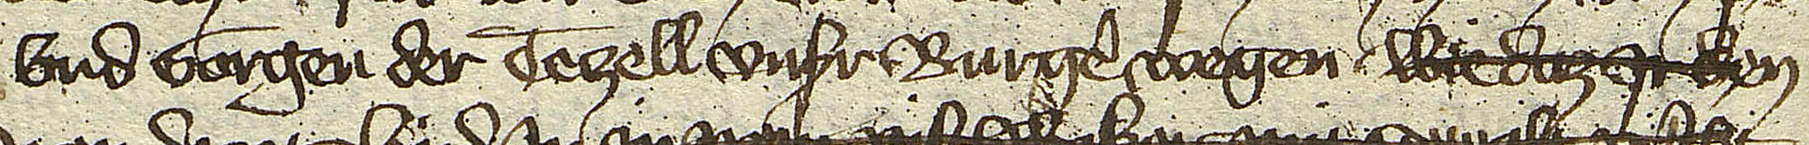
vnd Gorgen der Tecʒell vnſ*r Burge* wegen / wie daʒ Ir den
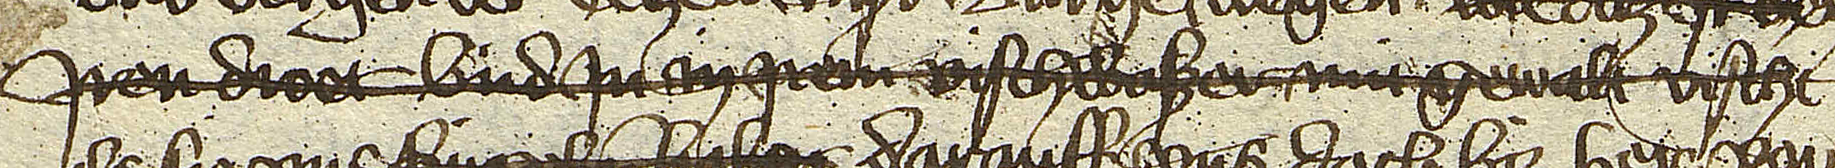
Iren droet vnd In in Irem viſchwaſʒer mit gewalt viſcht
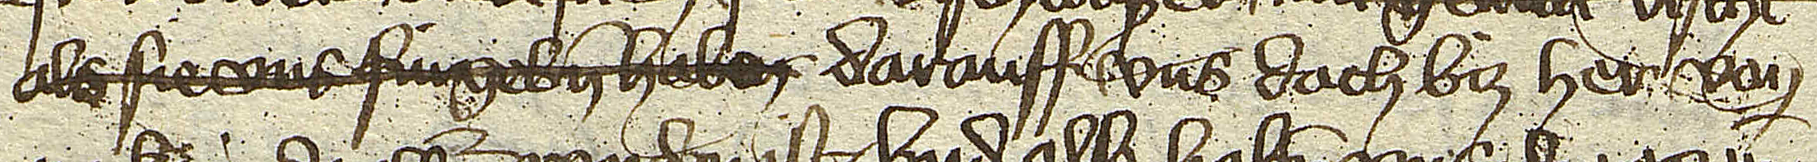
als ſie vns fürgebn* haben darauff vns doch biʒ her von
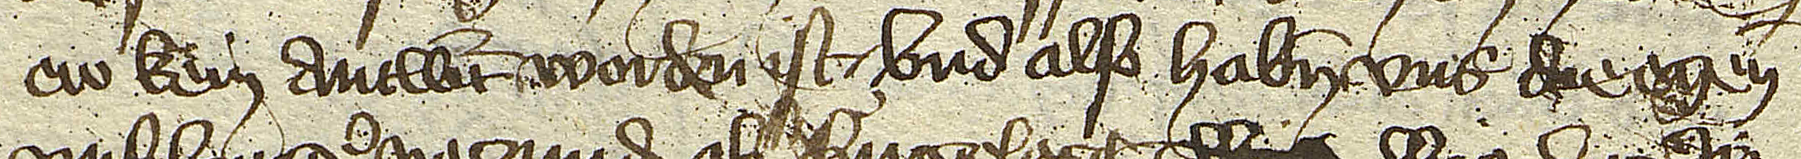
ew kein Antwt* worden iſt / vnd alſo habn* vns die egen
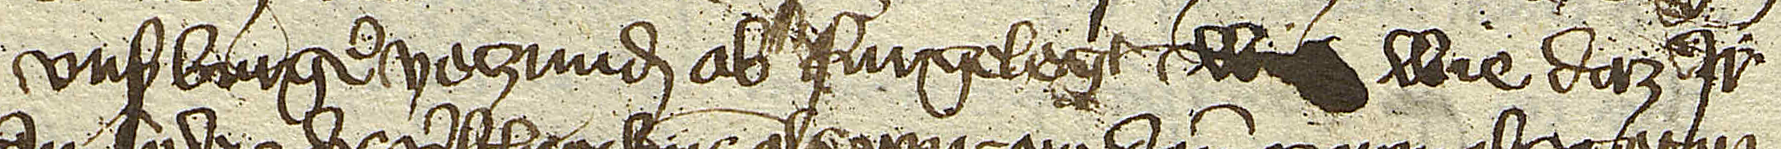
vnſ* burge* yecʒund* ab* fürgelegt wie wie daʒ Ir
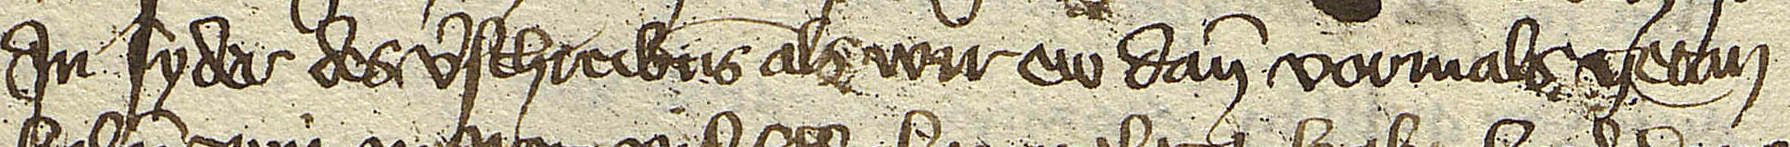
In ſyder des v*ſchreibns* als wir ew dan* vormals getan
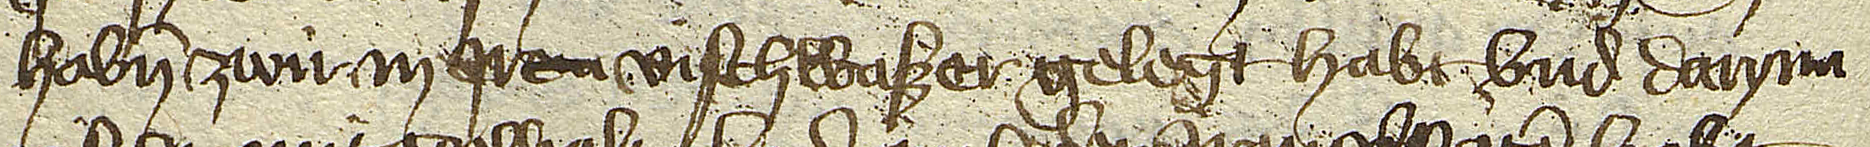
habn* cʒwir in Irem viſchwaſʒer gelegt habt vnd darynn
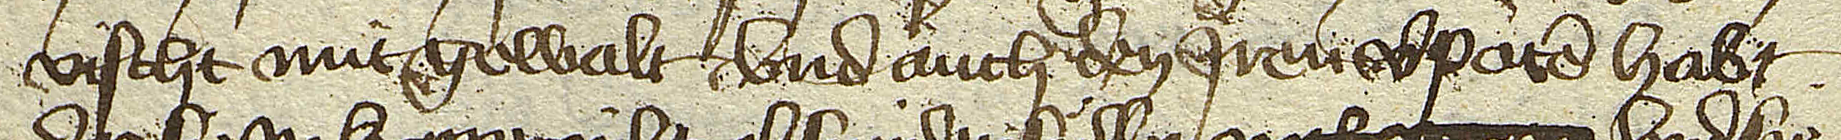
viſcht mit gewalt / vnd auch den Iren v*pote* habt
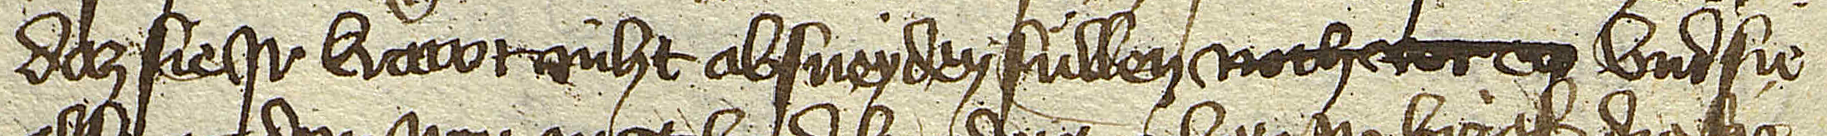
daʒ ſie Ir krawt niht abſneyden ſüllen noch vor ew vnd ſie
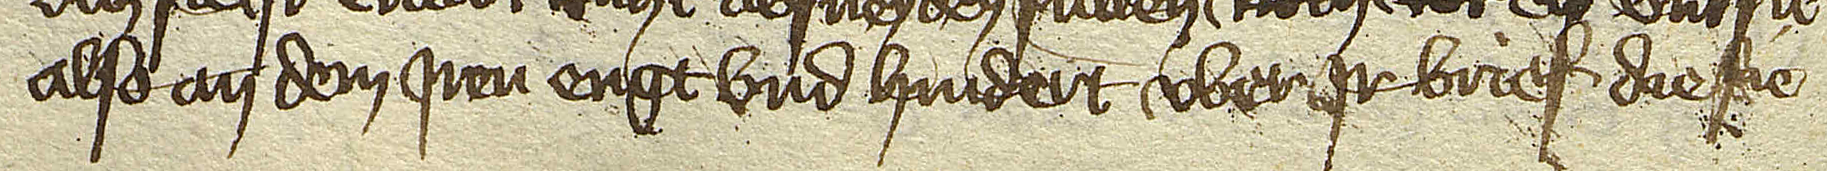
alſo an dem Iren engt vnd hindert vber Ir brief die ſie
